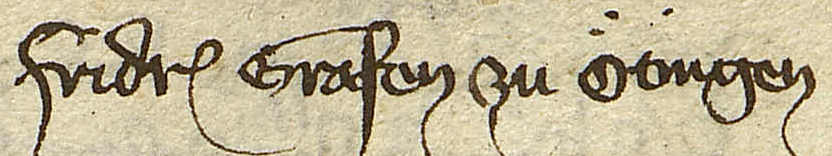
Fridr* Grafen cʒu Ötingen
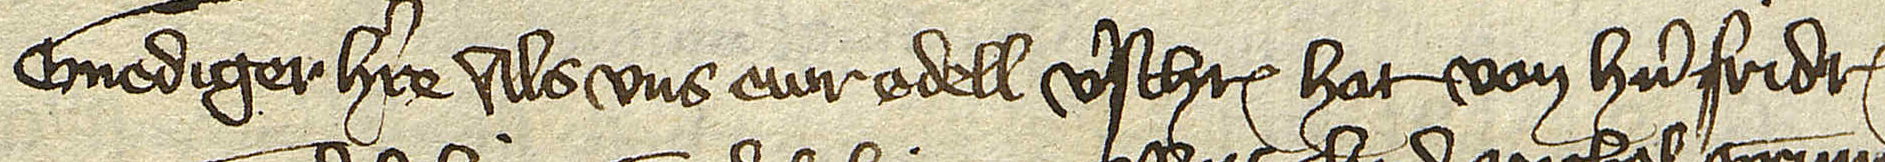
Gnediger h*re Als vns ewr edell v*ſchr* hat von hn* fridr*
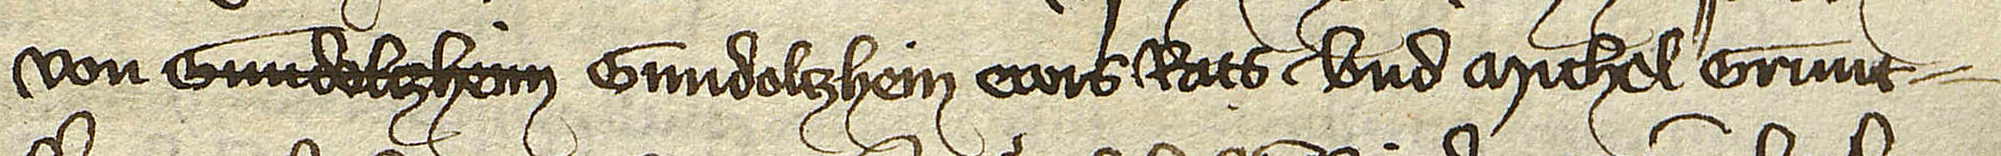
von Gundelcʒheim Gundelcʒhein ewrs Rats / vnd Michel Grunt =
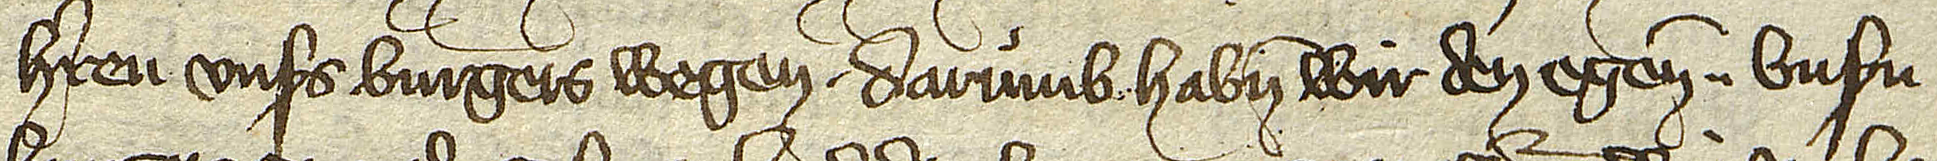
hr*en vnſ*s burgers wegen / Darümb habn* wir den egen* ~ vnſ*n
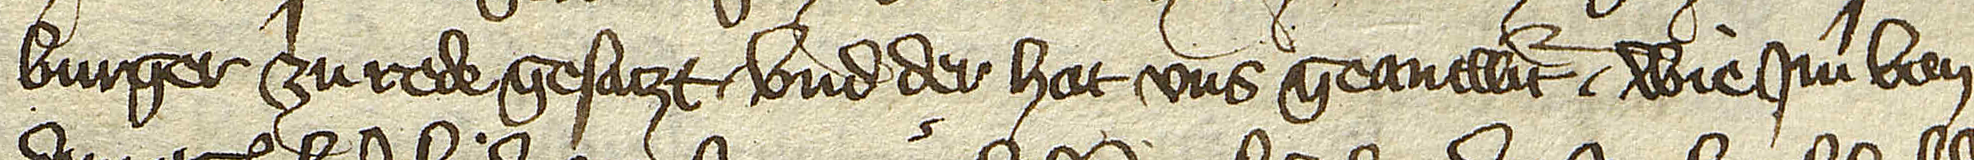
burger cʒu rede geſacʒt / vnd der hat vns geantwt* / wie Im bay
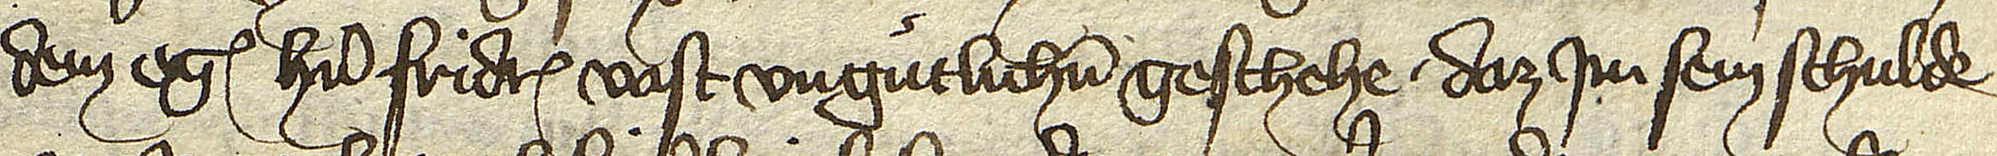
dem eg* hn* fridr* vaſt vngütlichn* geſchehe / daʒ Im ſein ſchulde
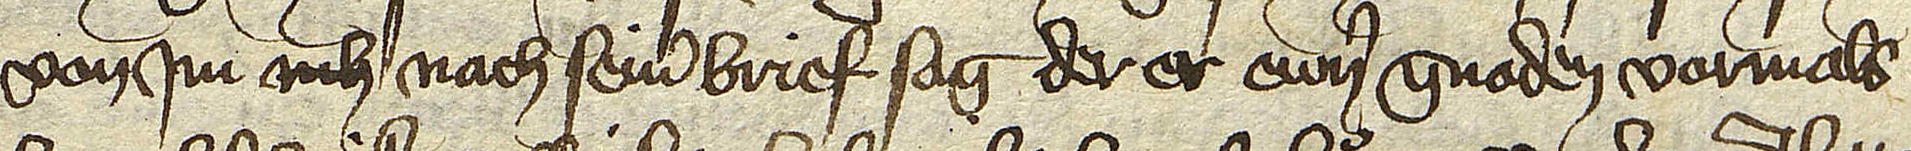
von Im nih nach ſein* brief ſag der er ewn* gnaden vormals
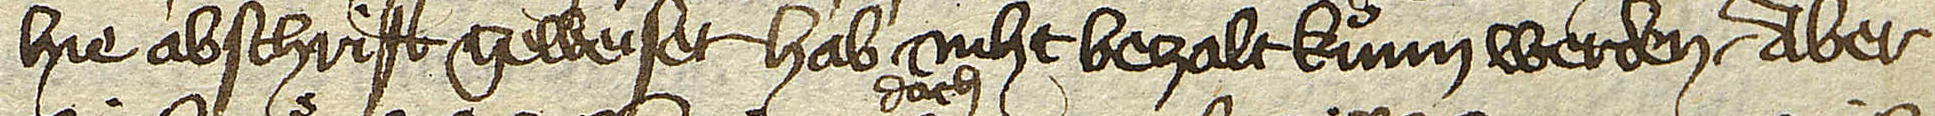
hie abſchrift geweiſet hab niht becʒalt künn werden / Aber
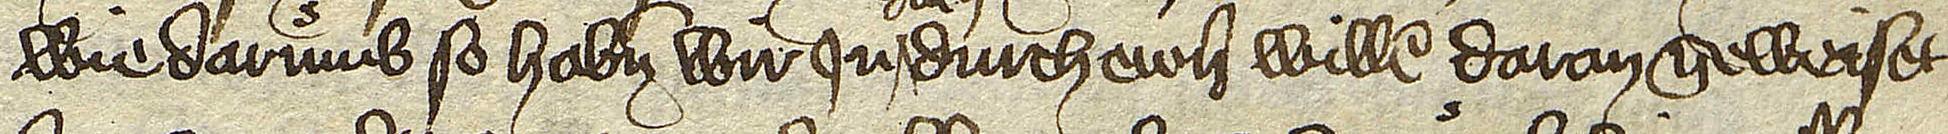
wie darümb ſo habn* wir In durch ewn* wille* daran geweiſet
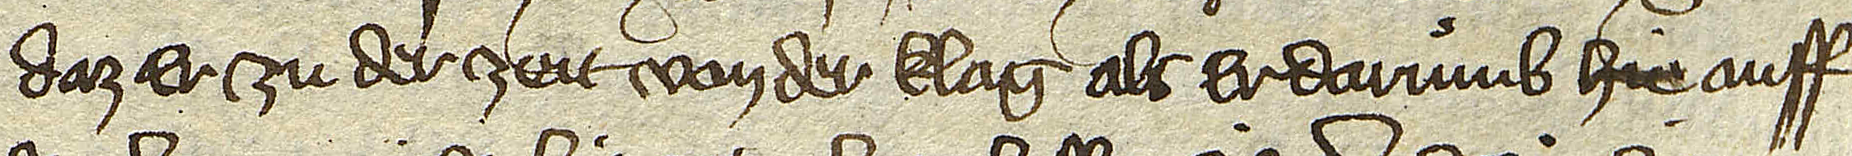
daʒ Er cʒu der cʒeit von der klag als Er darümb hie auff
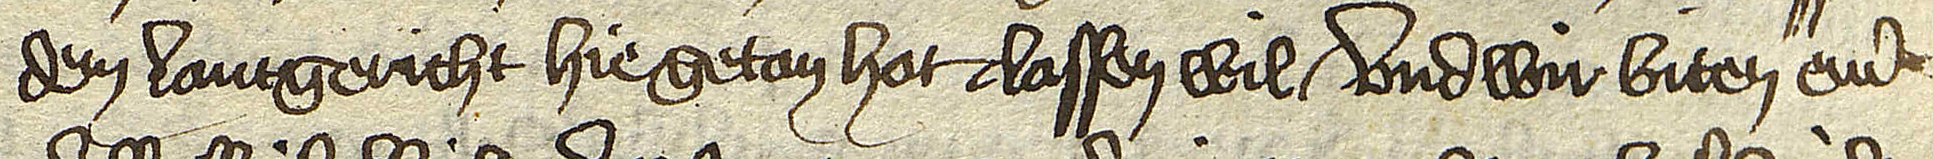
dem lantgericht hie getan hat / laſſen wil / vnd wir biten ew*
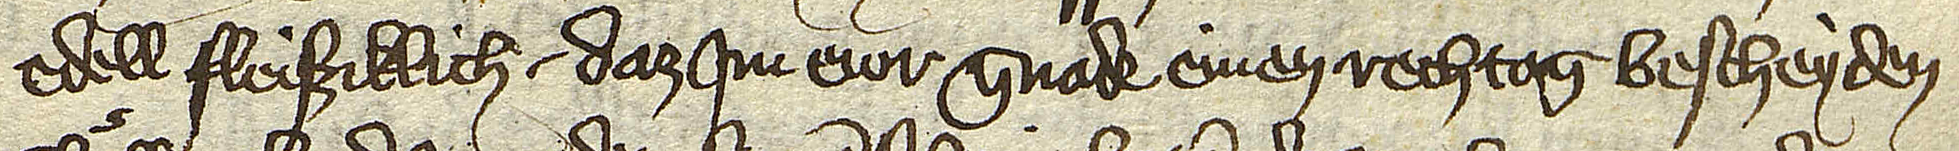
edell fleiſʒiklich / daʒ Im ewr gnade einen rechtag beſcheyden
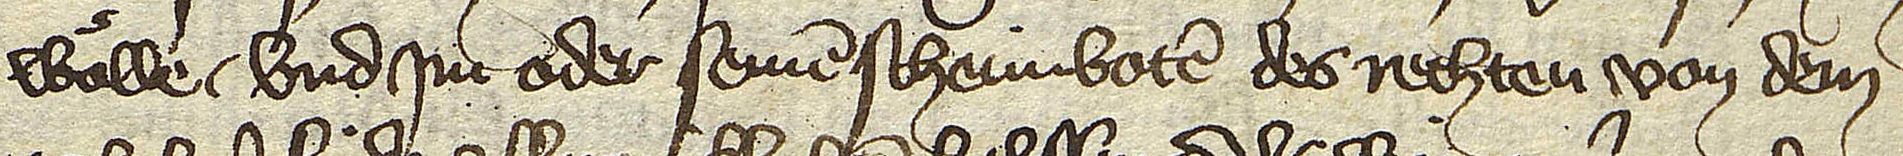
wölle / vnd Im oder ſeine* ſcheimbote* des rechten von dem
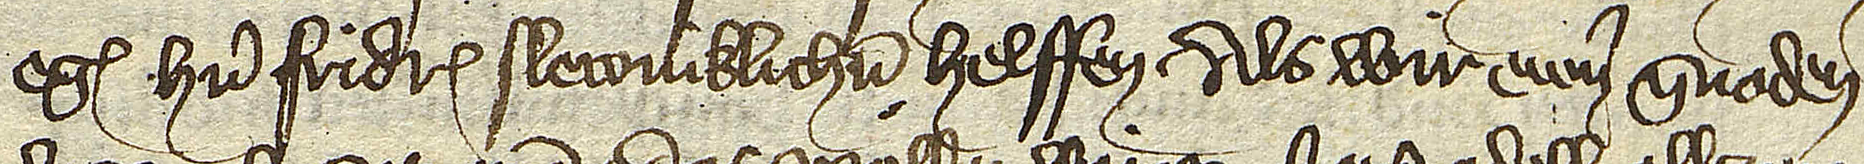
eg* hn* fridr* ſlewniklichn* helffen / Als wir ewn* gnaden
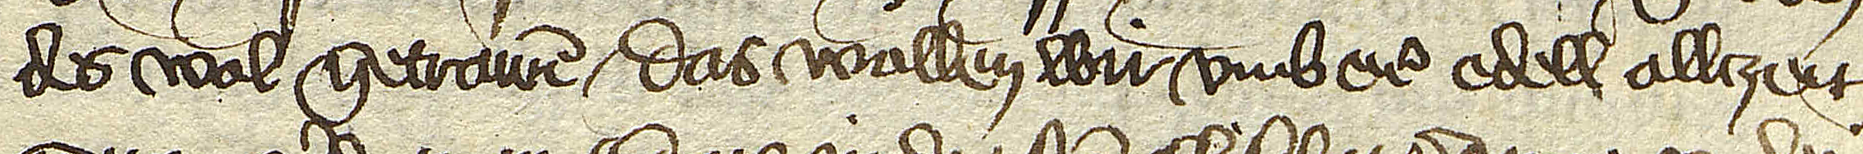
des wol getrawe* / das wöllen wir vmb ew* edell allcʒeit
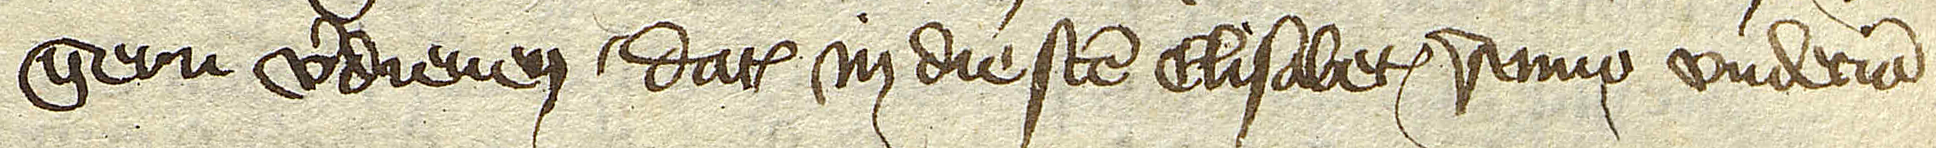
gern v*dienen / dat* in die ſce* Eliſabet* Anno vndecio*
